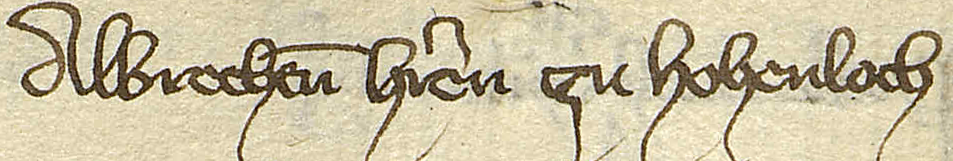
Albrechtn* hr*en cʒu hohenloch
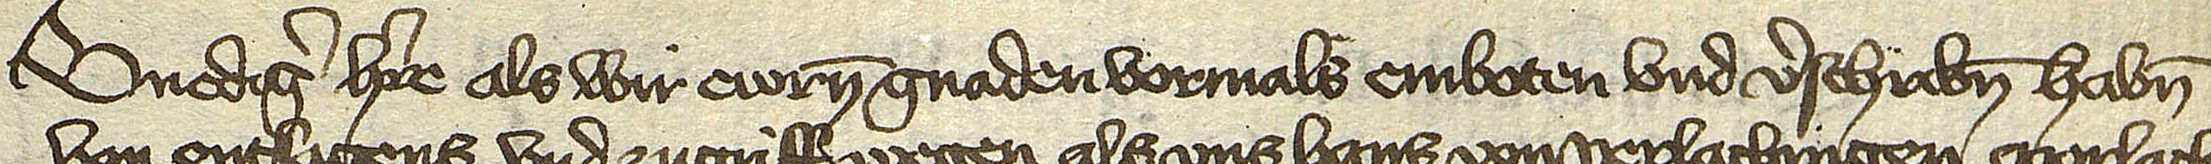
Gnedig* h*re als wir ewrn* gnaden vormals emboten vnd v*ſchribn* habn*
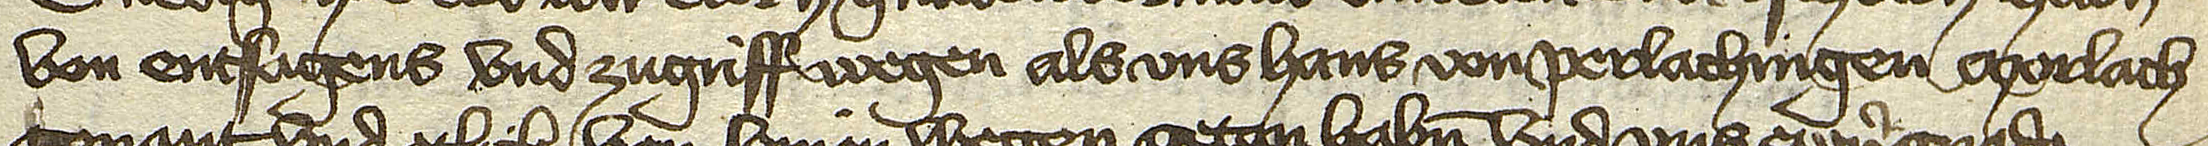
von entſagens vnd ʒugriff wegen als vns hans vol perlachingen Morlach
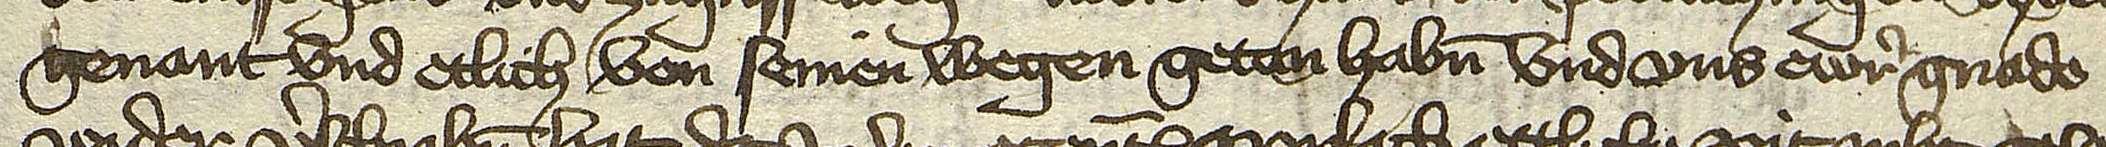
genant vnd etlich von ſeinen wegen getan habn* vnd vns ewr* gnade
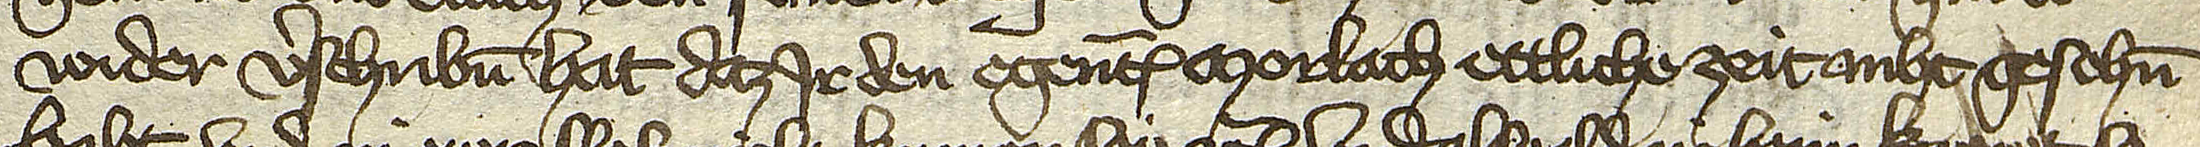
wider v*ſchribn* hat daʒ Ir den egen*t* Morlach ettliche ʒeit niht geſehn*
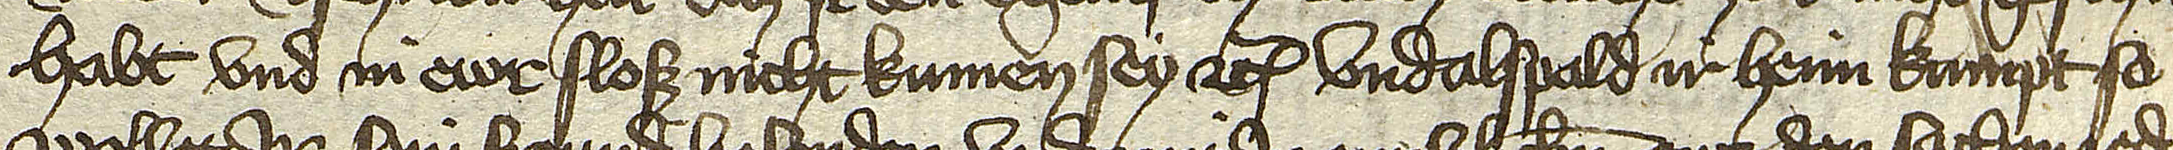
habt vnd in ewr ſloſʒ nicht kumen ſey ec* vnd alſpald ir heim kumpt ſo
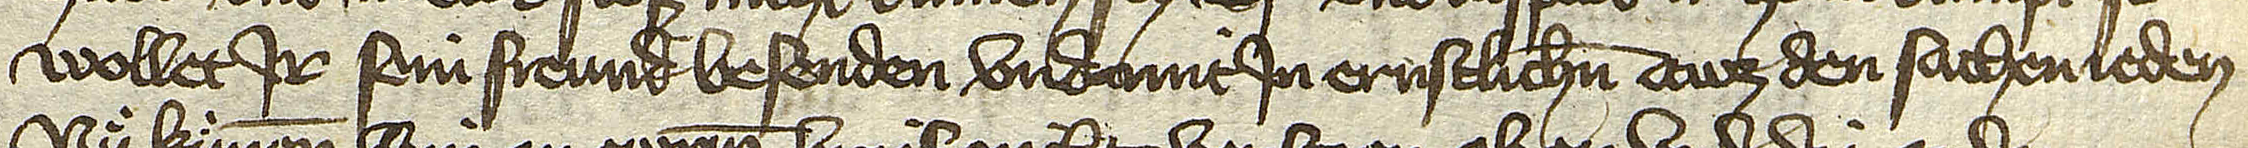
wollet Ir ſein freund beſenden vnd mit In ernſtlichn* awʒ den ſachen reden
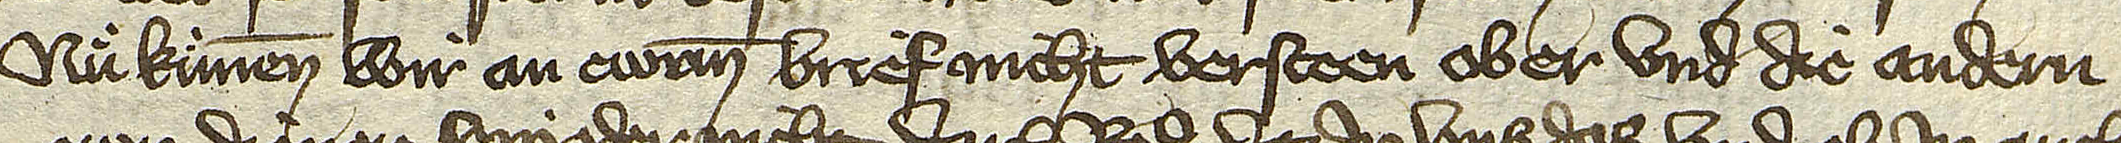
Nü künen* wir an ewrm* brief nicht verſteen ob er vnd die andern
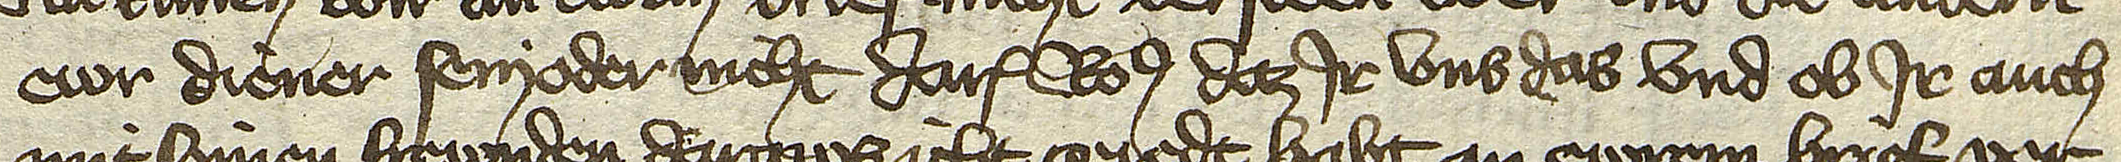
ewr diener ſein oder nicht dar* Ro* daʒ Ir vns das vnd ob Ir auch
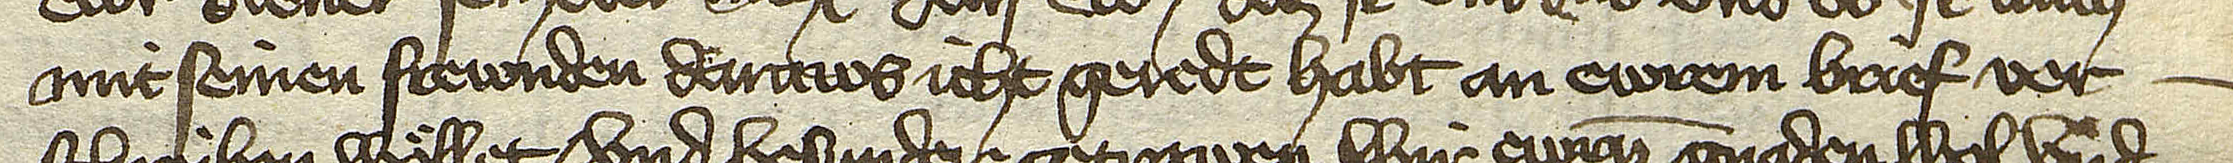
mit ſeinen frewnden daraws icht geredt habt an ewrem brief ver -
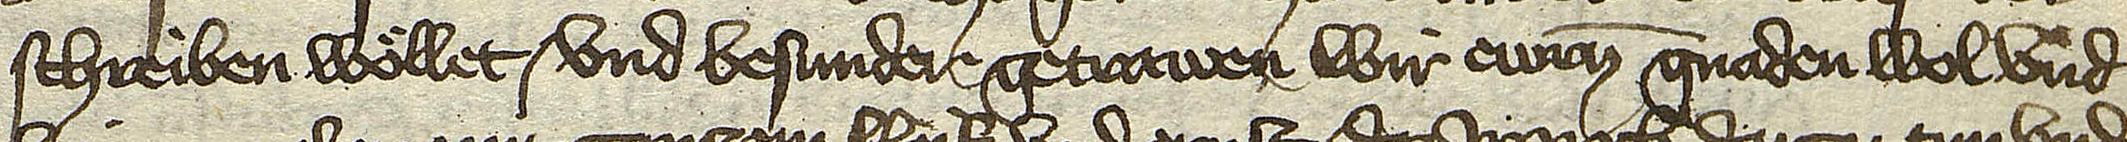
ſchreiben wöllet / vnd beſunder getrawen wie ewrn* gnaden wol vnd
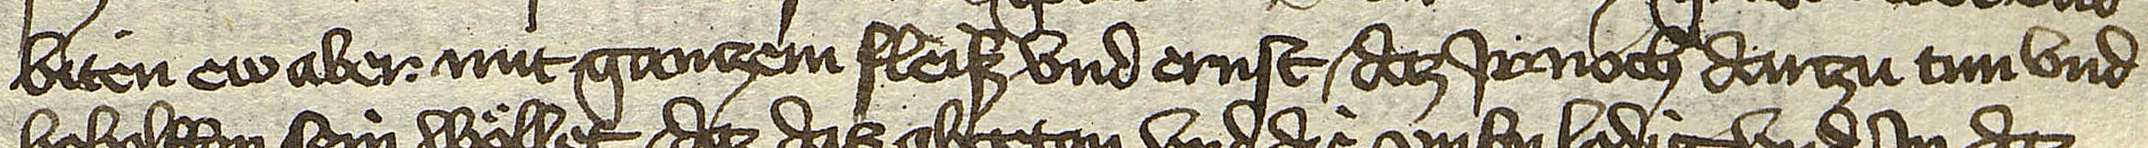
biten ew aber mit gancʒem fleiſʒ vnd ernſt / daʒ Ir noch darcʒu tun vnd
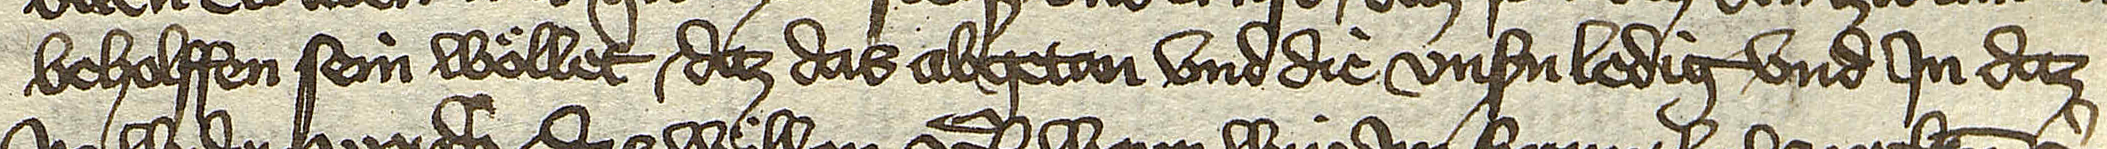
behollfen ſein wöllet / daʒ das abgetan vnd die vnſ*n ledig vnd In daʒ
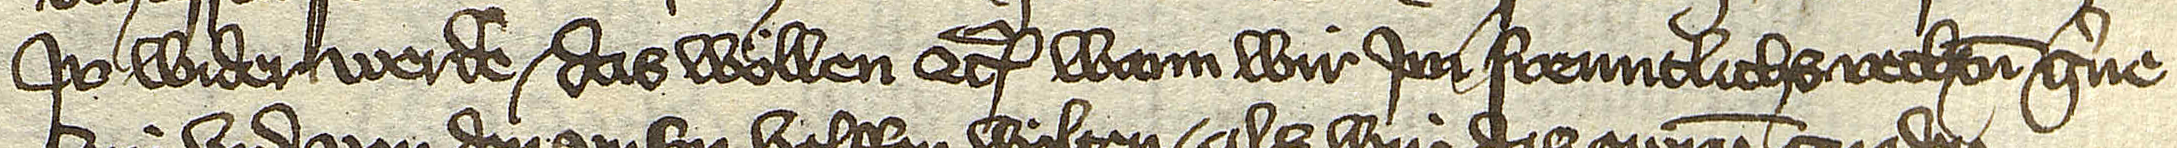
Ir wider werde / das wöllen ec* wann wir Im freuntlichs rechtn* g*ne
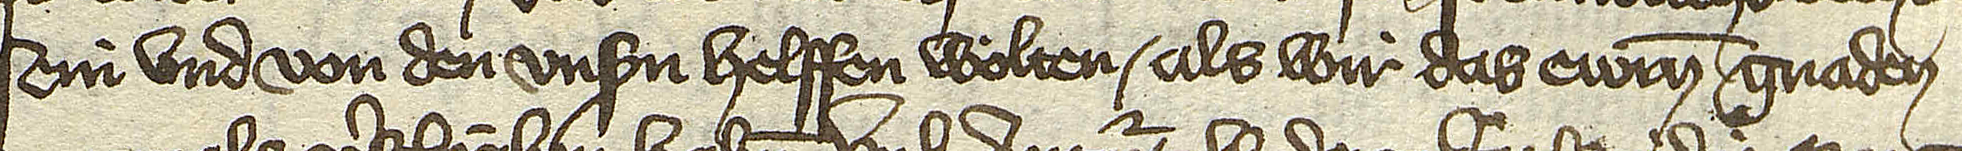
ſein vnd von den vnſ*n helffen wölten / als wir das ewrn* gnaden
